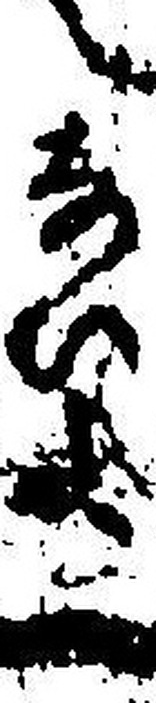ないよ
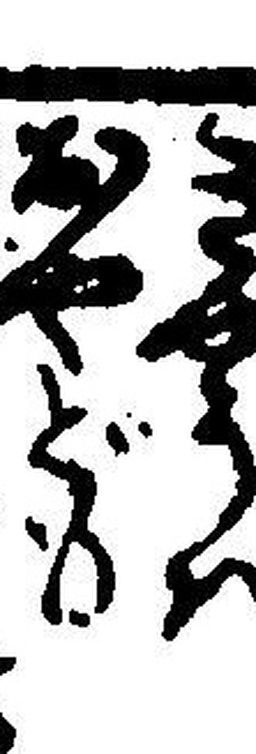おやども
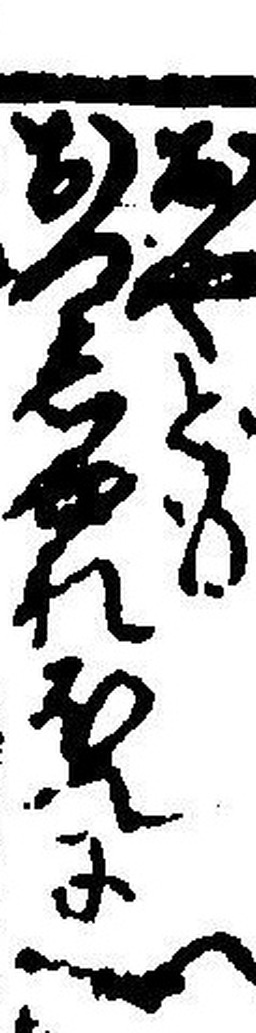おつしやれほんに
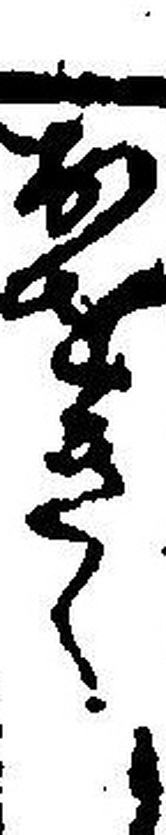おをきく
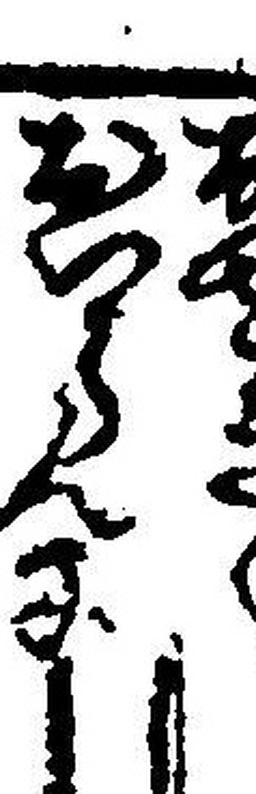おいらんに
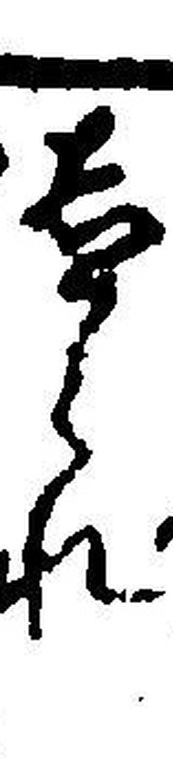しかられ
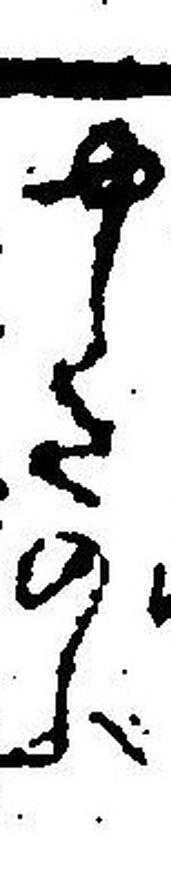やしたのふ
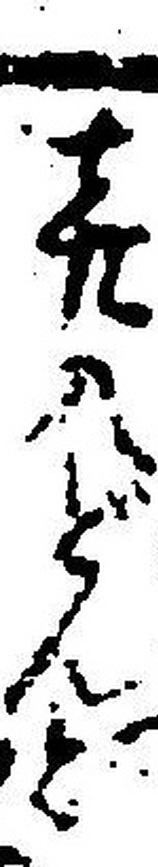喜八どんと

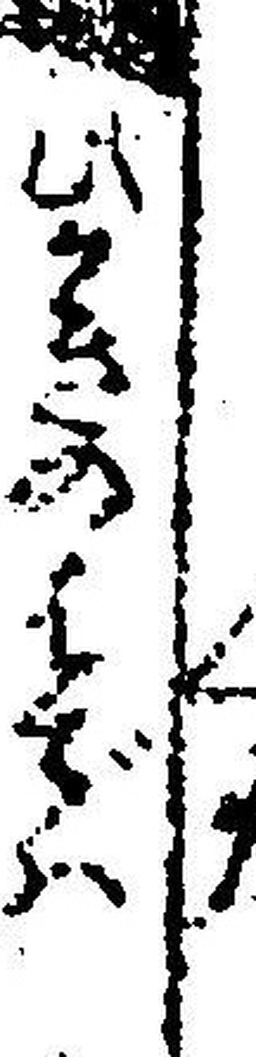此かきのはでは
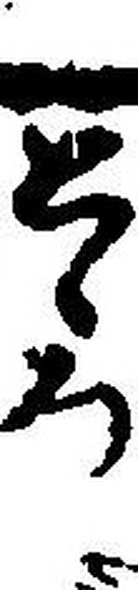こゝろ
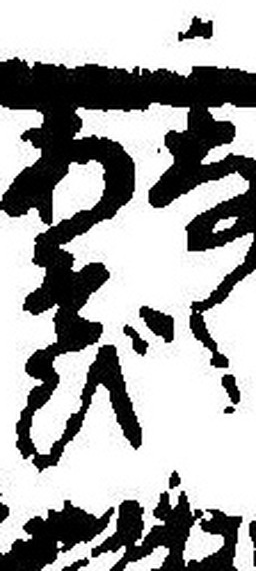あそび
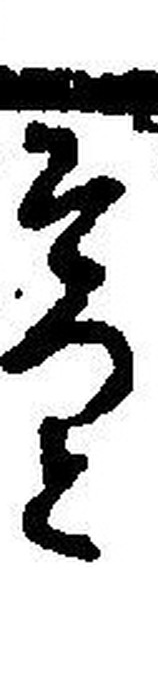そつと
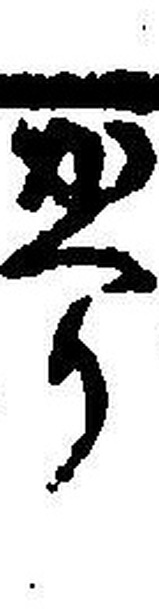かへり
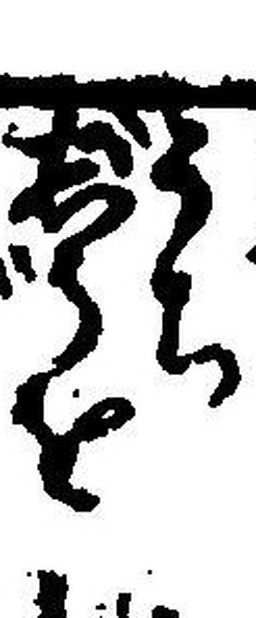じうを
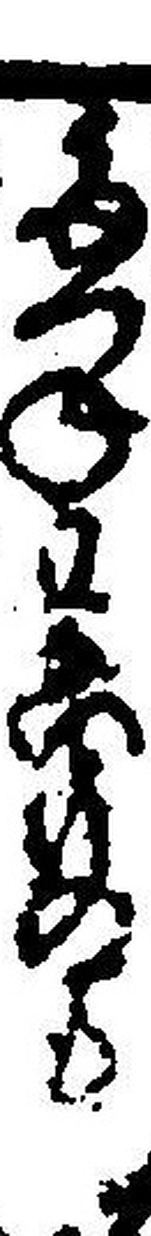たづねわかいものも
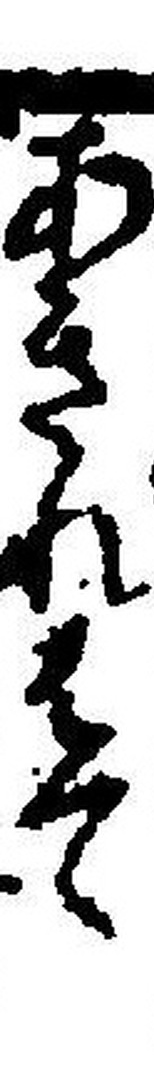あきれはて
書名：間違狐之女郎買 / 市場通笑作
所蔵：東京大学総合図書館 General Library in the University of Tokyo, JAPAN
